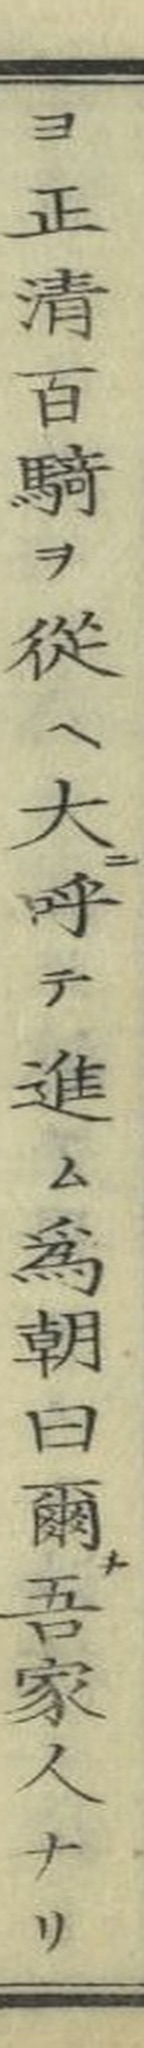ヨ正清百騎ヲ從ヘ大呼テ進ム爲朝曰爾吾家人ナリ
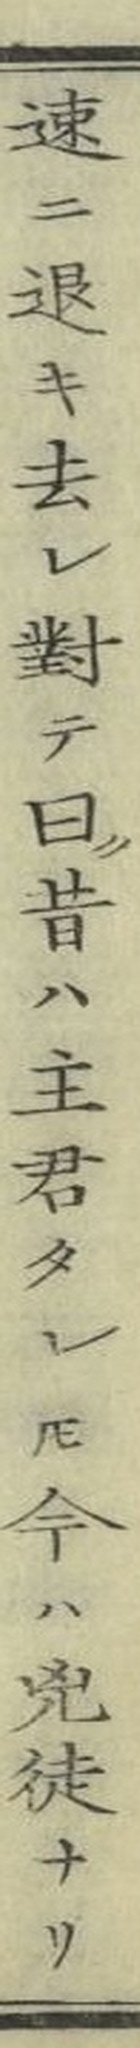速ニ退キ去レ對テ曰昔ハ主君タレトモ今ハ兇徒ナリ
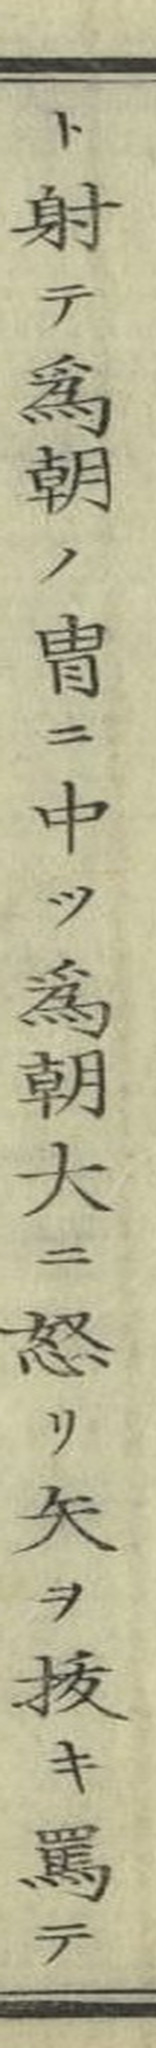ト射テ爲朝ノ冑ニ中ツ爲朝大ニ怒リ矢ヲ抜キ罵テ
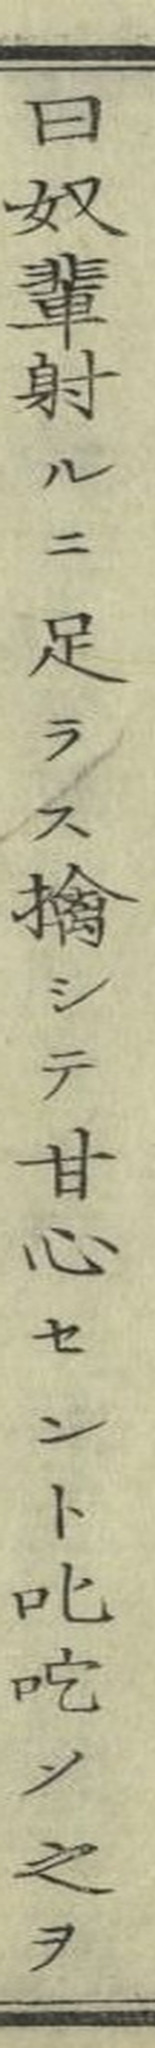曰奴輩射ルニ足ラス擒シテ甘心セント叱咤シテ之ヲ
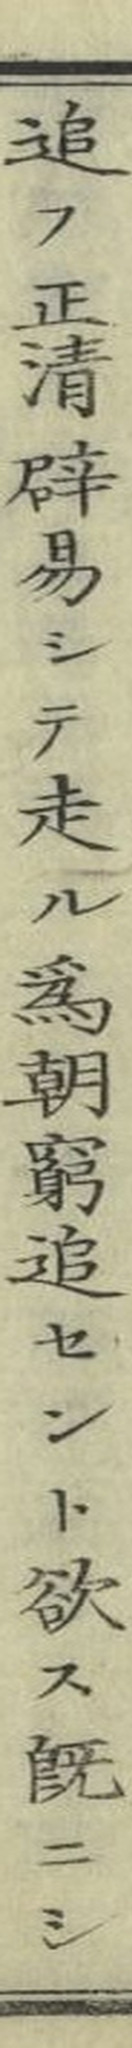追フ正清辟易シテ走ル爲朝窮追セント欲ス既ニシ
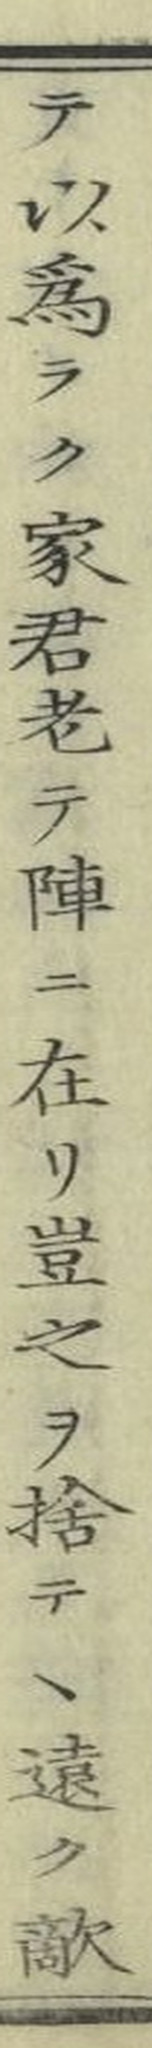テ以爲ラク家君老テ陣ニ在リ豈之ヲ捨テヽ遠ク歒
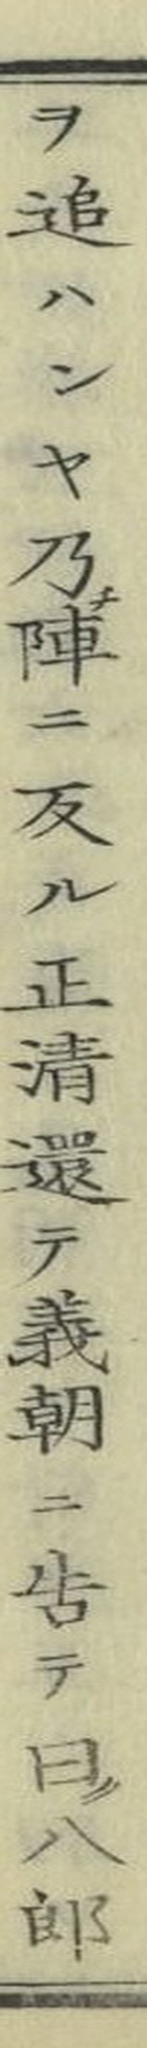ヲ追ハンヤ乃陣ニ反ル正清還テ義朝ニ告テ曰八郎
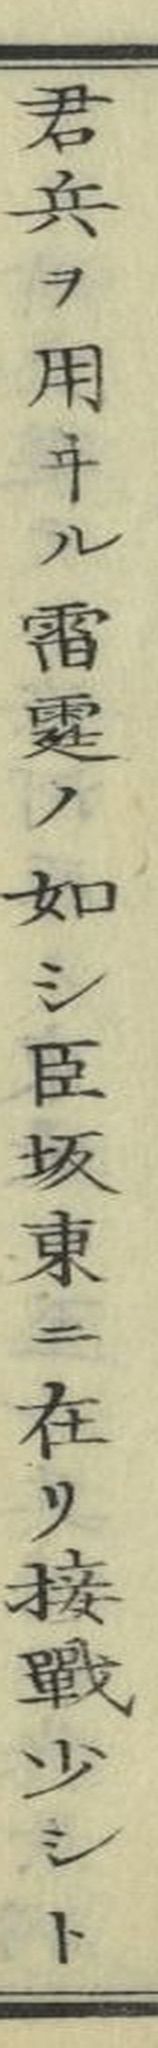君兵ヲ用ヰル雷霆ノ如シ臣板東ニ在リ接戰少シト
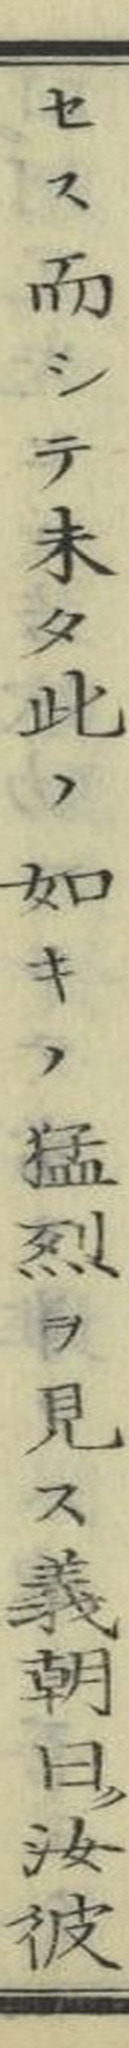セス而シテ未タ此ノ如キノ猛烈ヲ見ス義朝曰汝彼
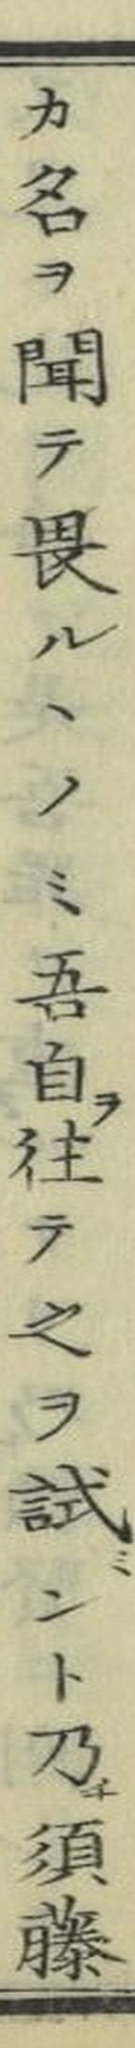カ名ヲ聞テ畏ルヽノミ吾自往テ之ヲ試ント乃須藤
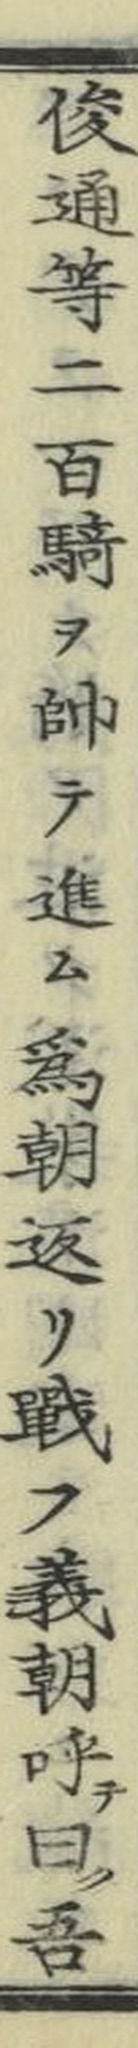俊通等二百騎ヲ帥テ進ム爲朝返リ戰フ義朝呼曰吾
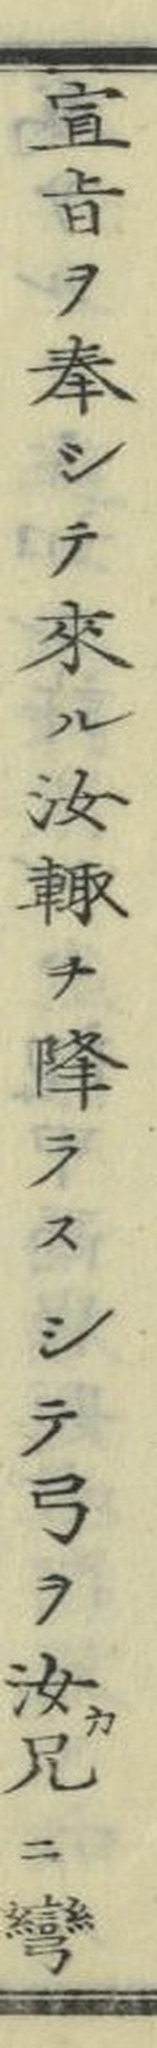宜㫖ヲ奉シテ來ル汝輙チ降ラスシテ弓ヲ汝兄ニ彎
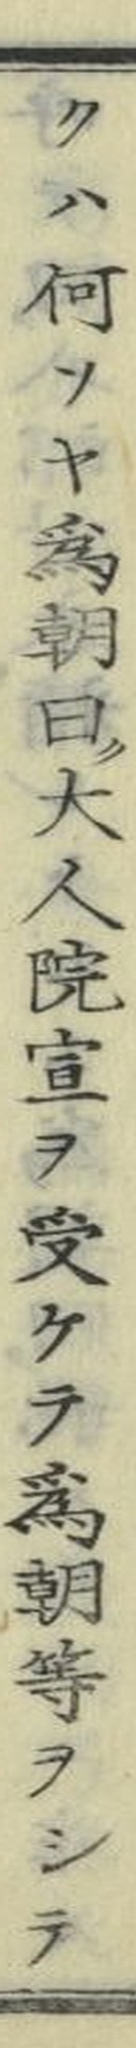クハ何ソヤ爲朝曰大人院宣ヲ受ケテ爲朝等ヲシテ
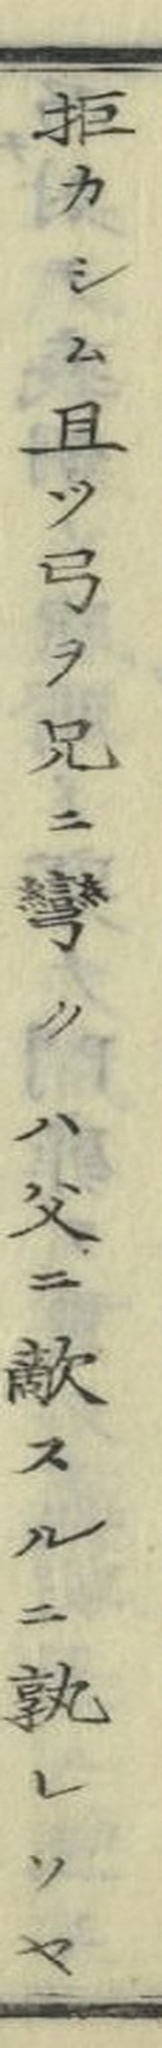拒カシム且ツ弓ヲ兄ニ彎クハ父ニ歒スルニ孰レリヤ
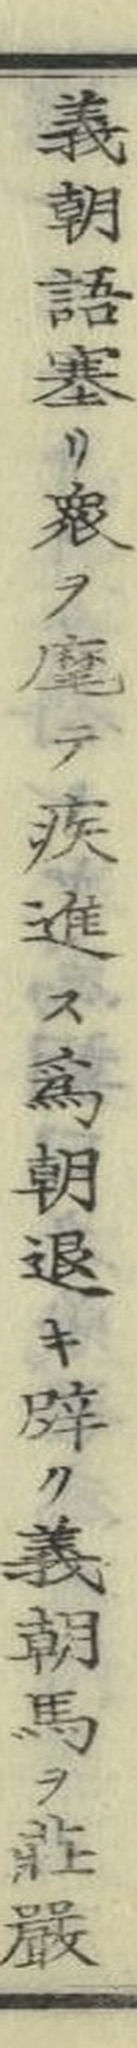義朝語塞リ衆ヲ麾テ疾進ス爲朝退キ辟ク義朝馬ヲ莊嚴
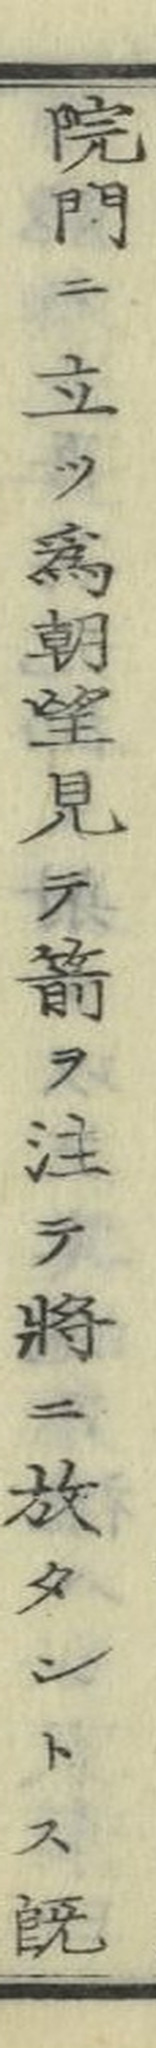院門ニ立ツ爲朝望見テ箭ヲ注テ將ニ放タントス既
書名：琉球藩史 一之巻
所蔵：University of the Ryukyus Library
